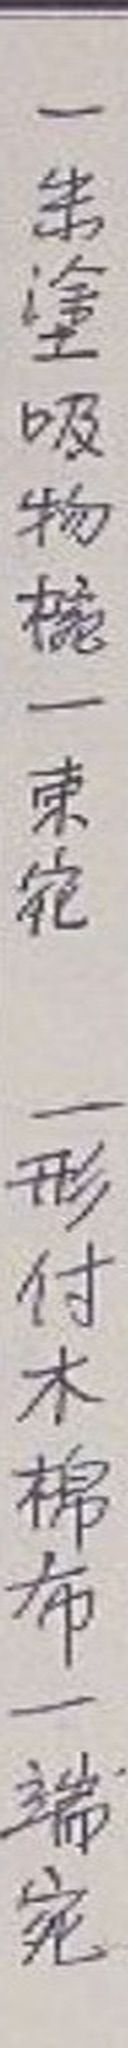一朱塗吸物椀一束宛一形付木棉布一端宛
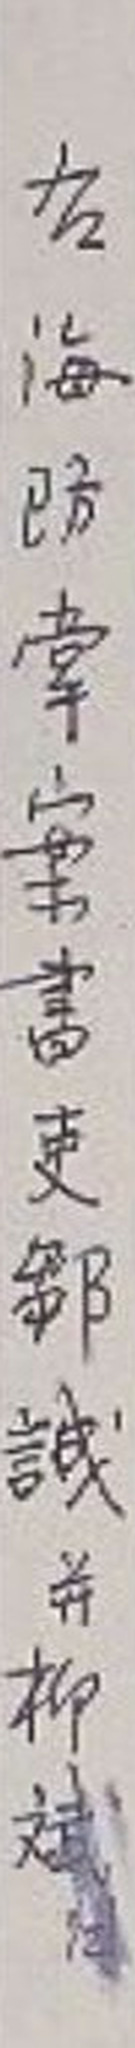右海防掌案書吏鄒誠并柳斌え
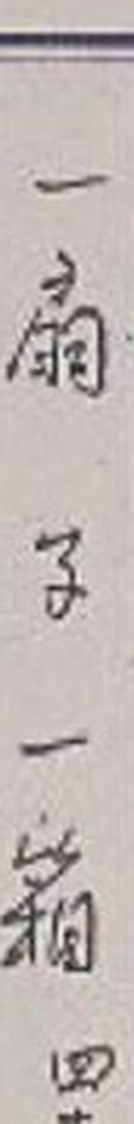一扇子一箱一白麻一束
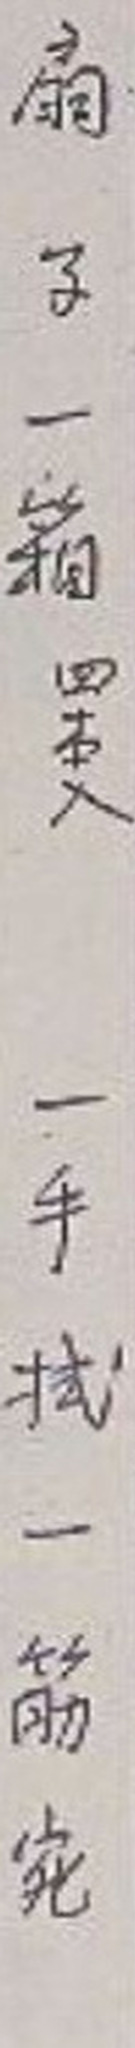一扇子一箱四本入一手拭一筋宛
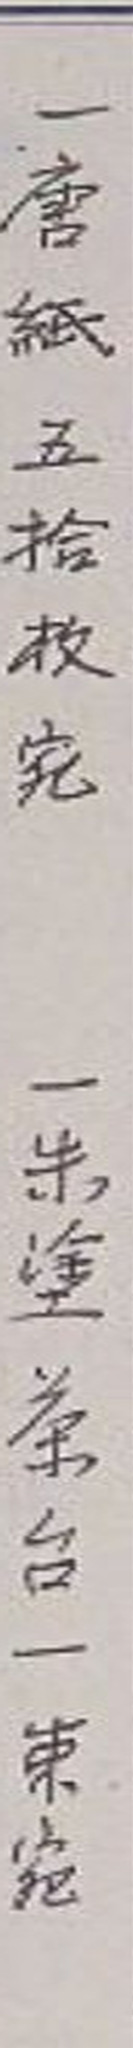一唐紙五拾枚宛一朱塗茶台一束宛
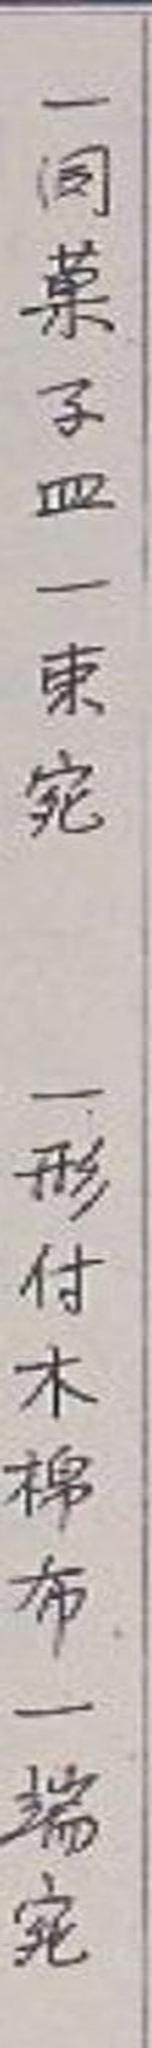一同菓子皿一束宛一形付木棉布一端宛

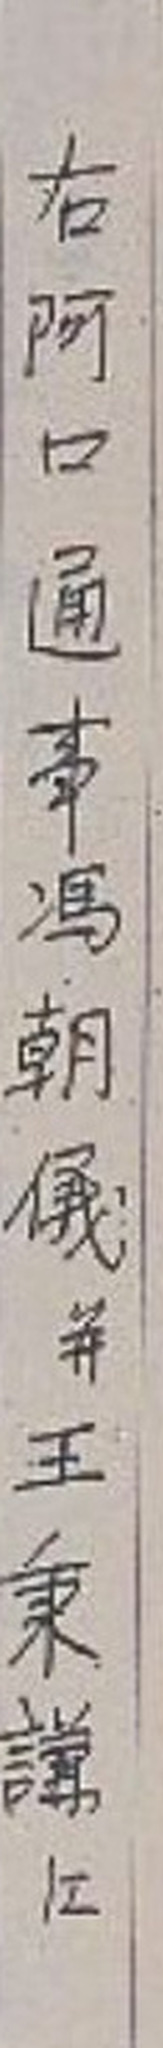右阿口通事馮朝儀并王秉謙え
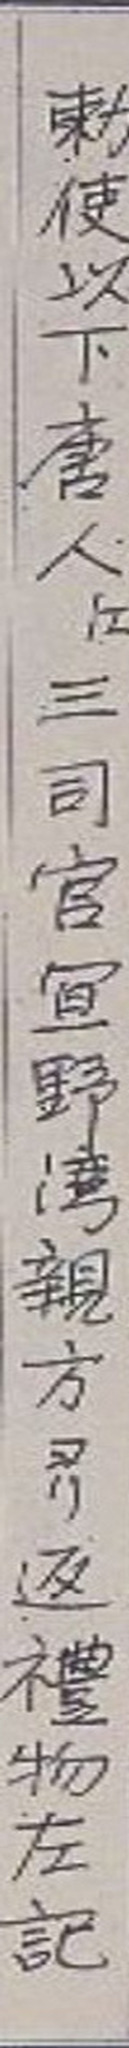勅使以下唐人え三司官宜野湾親方より返礼物左記
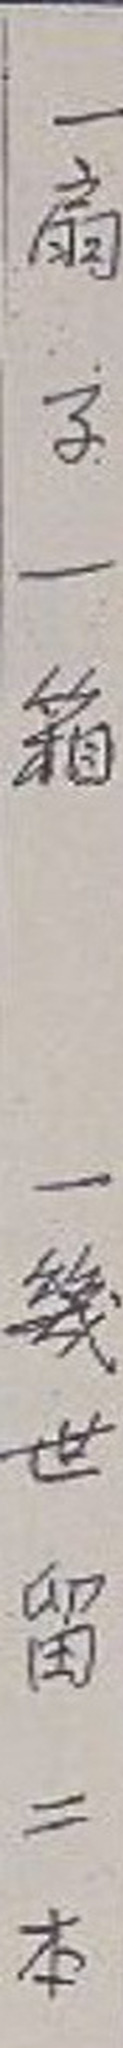一扇子一箱一幾世留二本
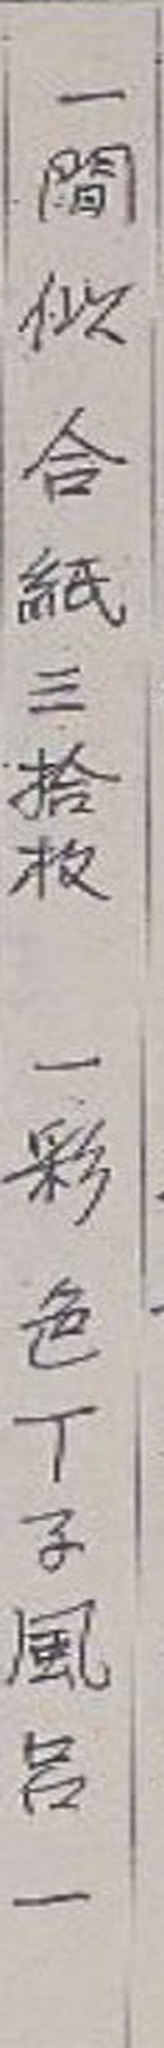一間似合紙三拾枚一彩色丁子風呂一
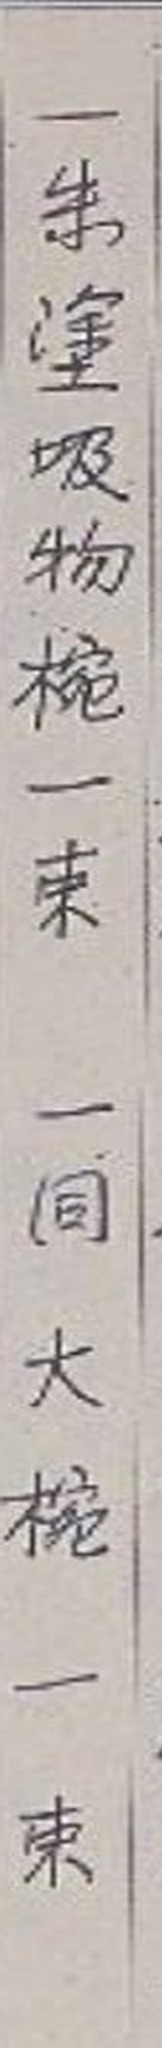一朱塗吸物椀一束一同大椀一束
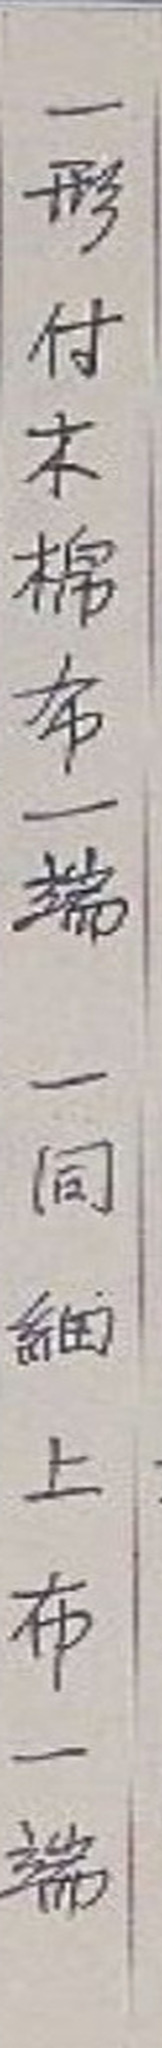一形付木棉布一端一同細上布一端
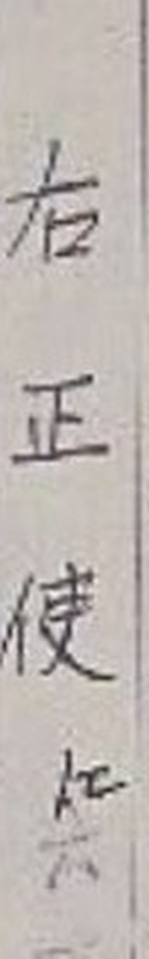右正使え
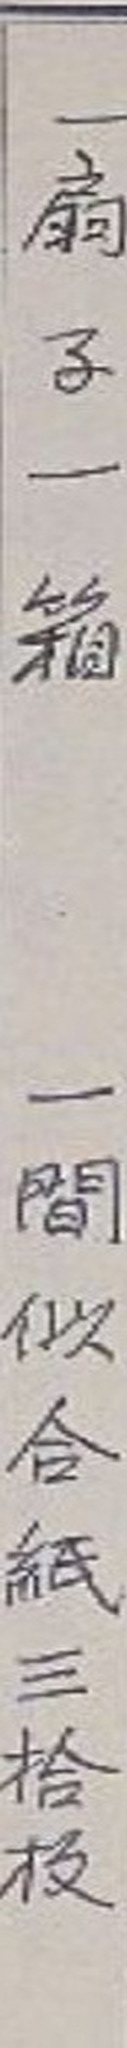一扇子一箱一間似合紙三拾枚
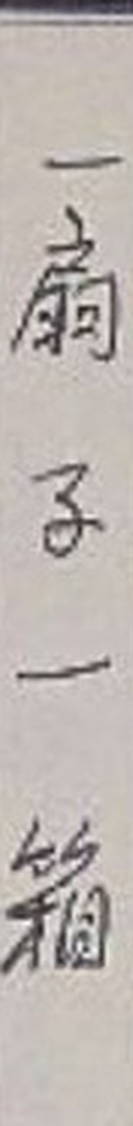一扇子一箱
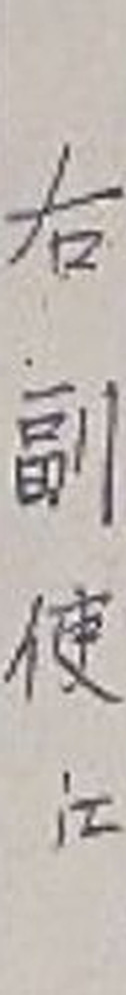右副使え
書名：支那冊封使来琉諸記 下巻
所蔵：University of the Ryukyus Library
